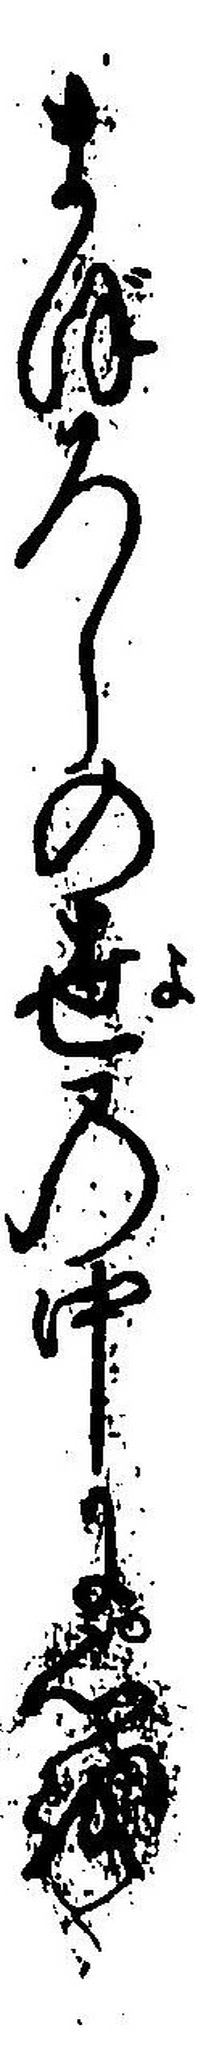まぼろしの世の中に。心を
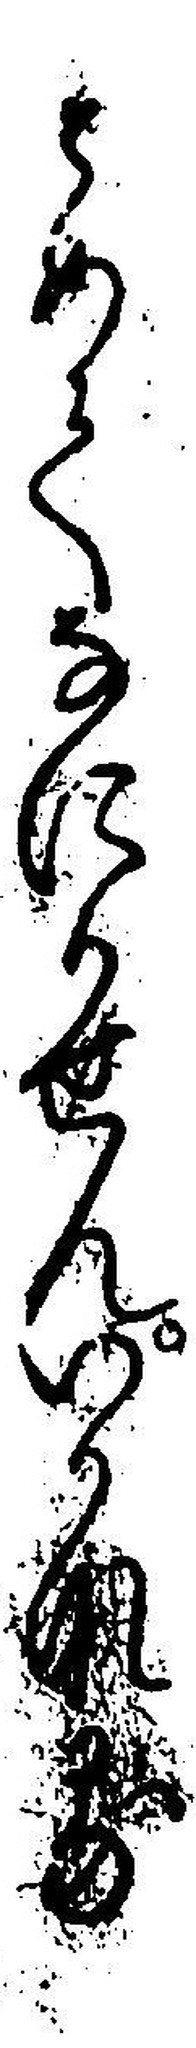とめてなにかせん。いかなる
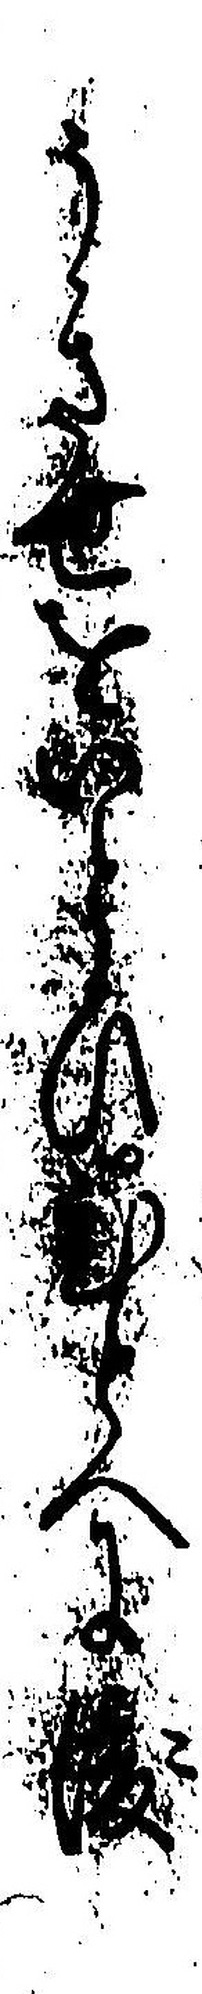うき世をいとひ。ひとへに後

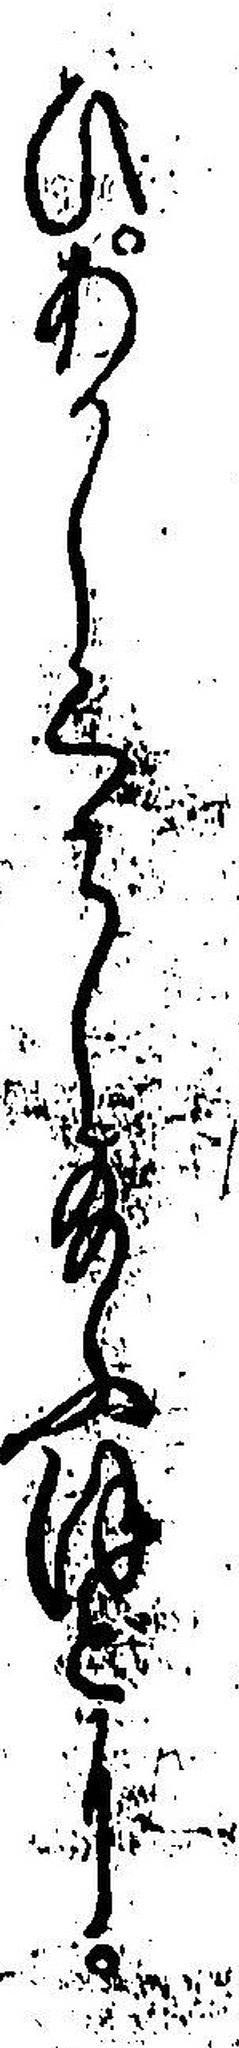ひ。あかしくらし給ふほどに。
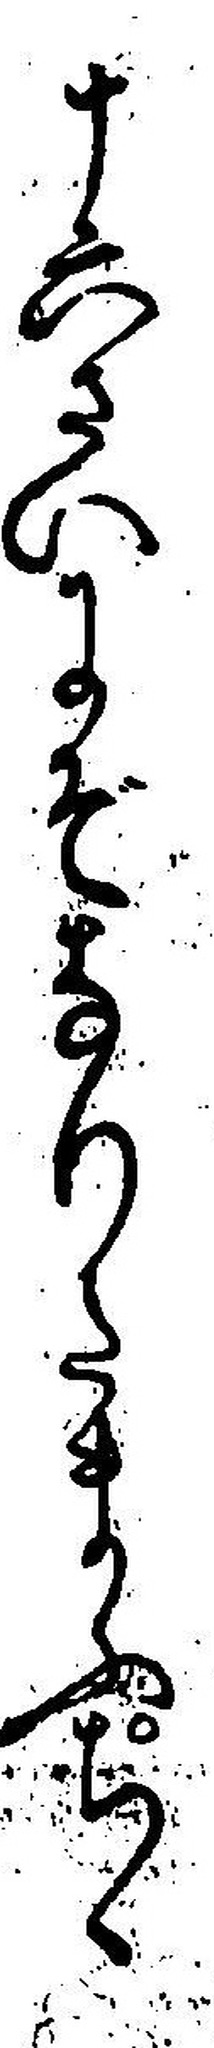十六さいにぞなりたまふ。ちゝ
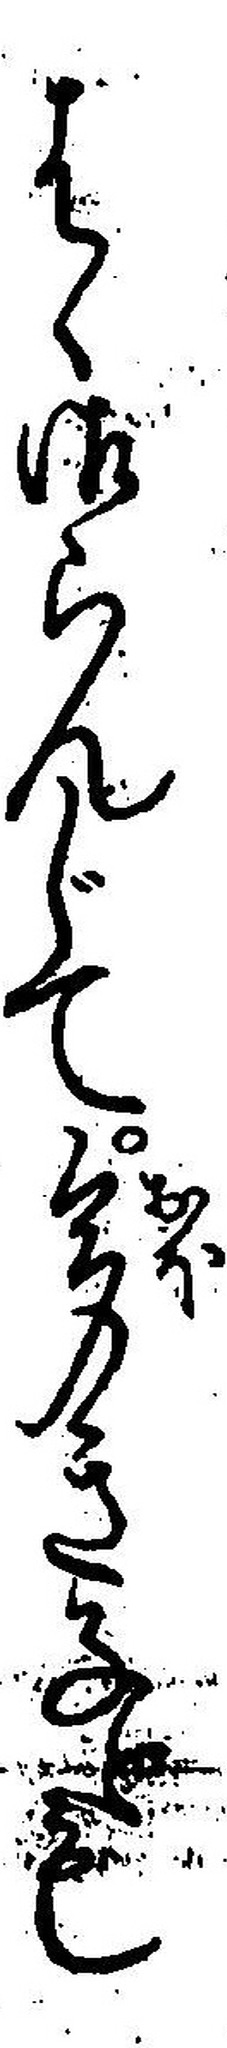はゝ御らんじて。多き子ども
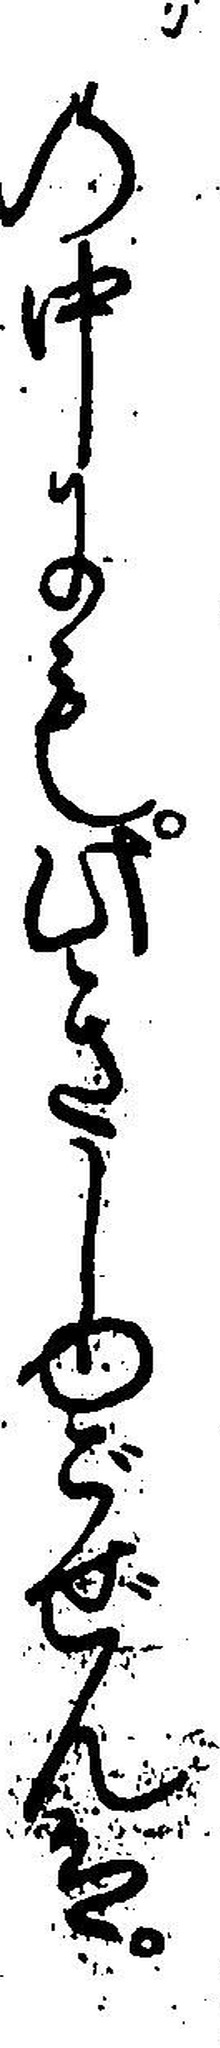の中にも。此きしゆごぜんは。
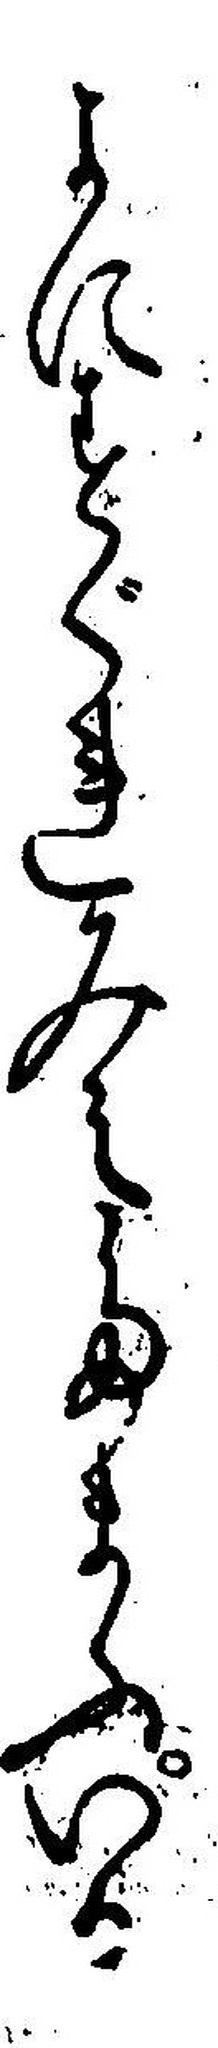よにすぐれみえたまふ。いか
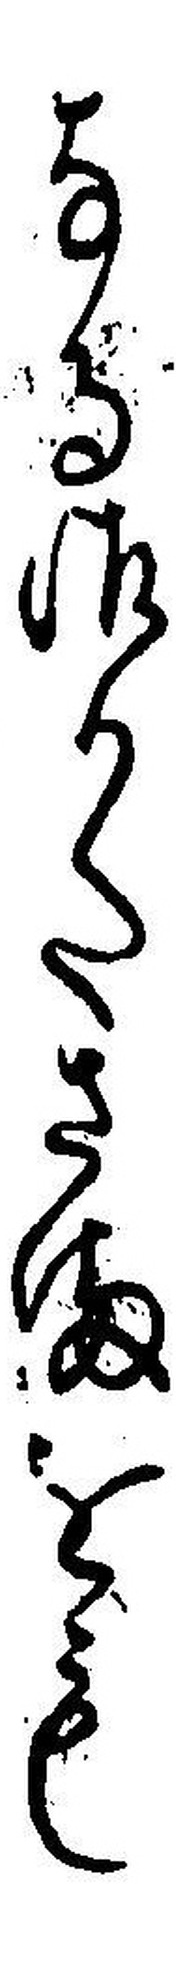なる御かたさまをも
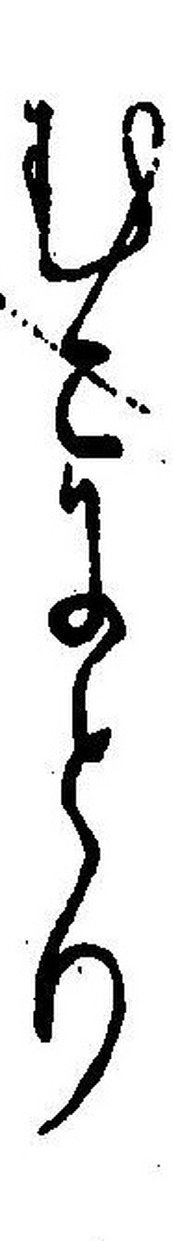むこにとり
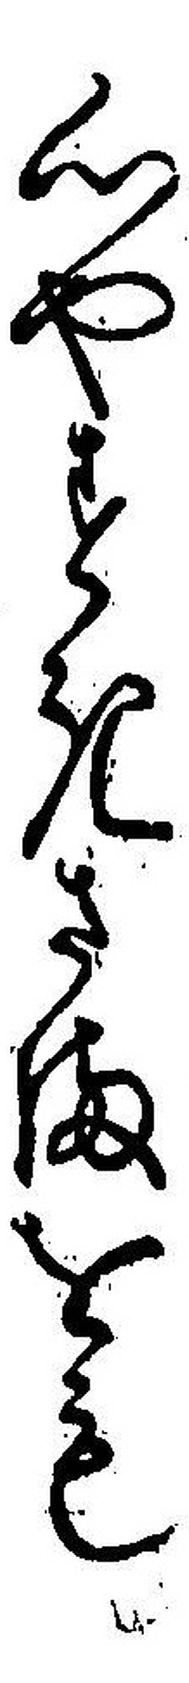心やすきさまをも
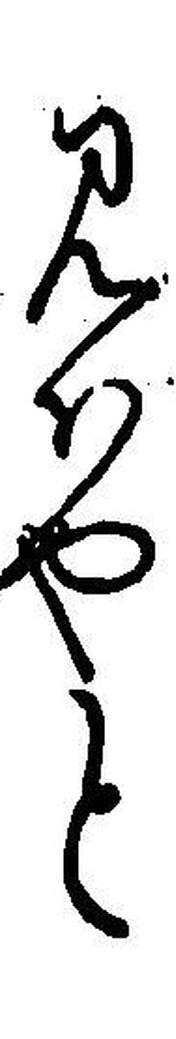見はやと
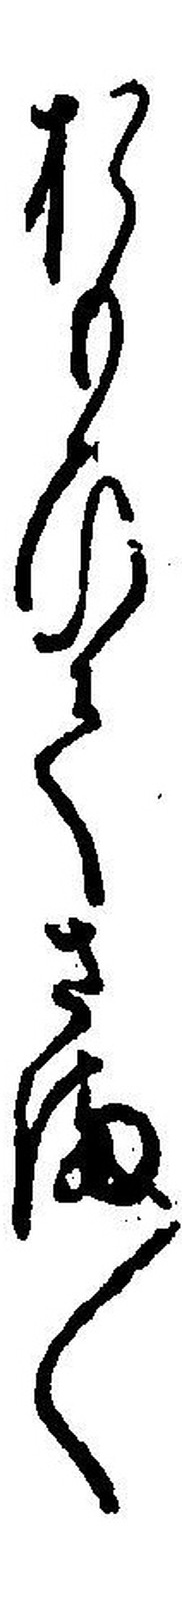おもひてさま〳〵
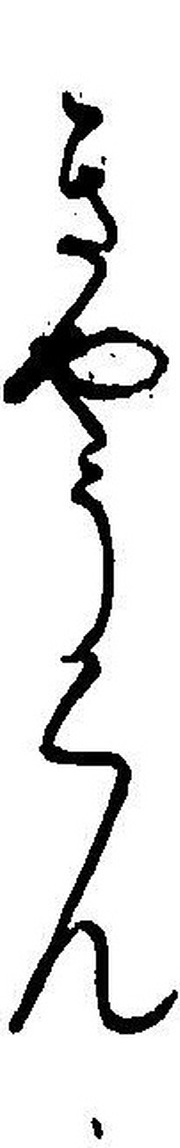きやうくん
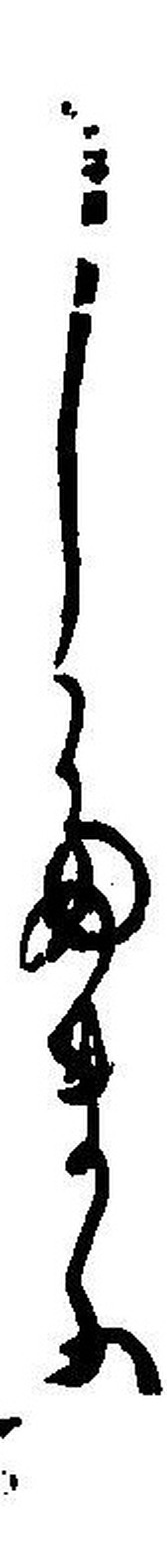したまふ

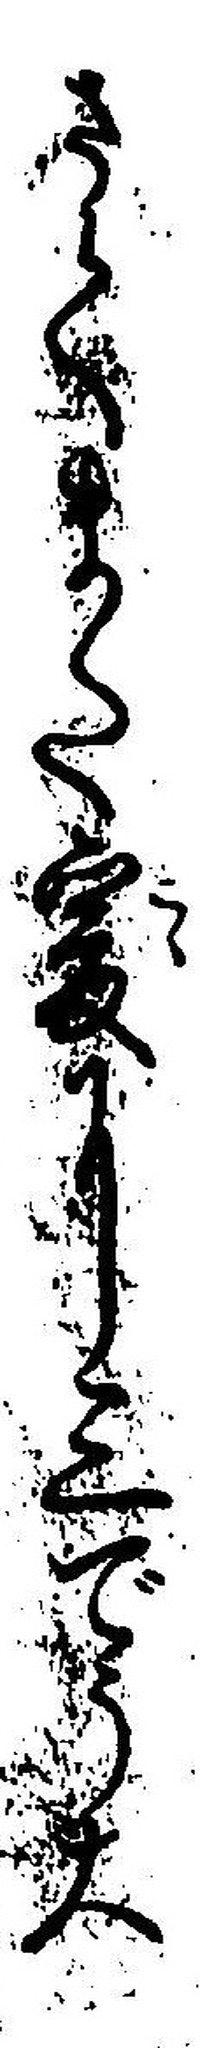さてまた爰に三でう大
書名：木幡きつね
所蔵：東京大学総合図書館 General Library in the University of Tokyo, JAPAN
